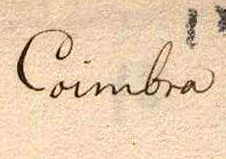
Coimbra
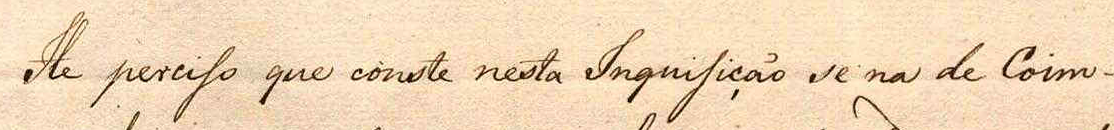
este perciso que conste nesta Inquisiçaõ se na de Coim
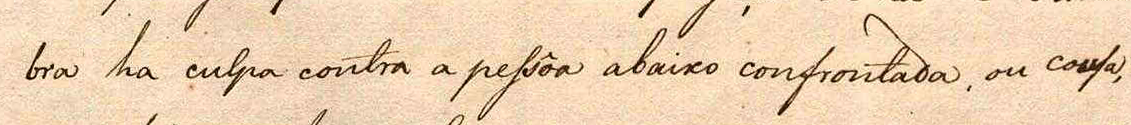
bra ha culpa contra a pessoa abaixo confrontada, ou cousa,
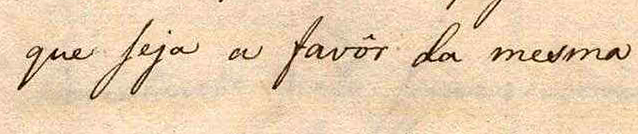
que seja a favor da mesma
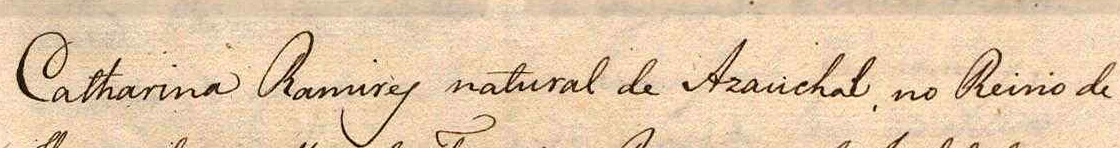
Catharina Ramires natural de Azauchal, no Reino de
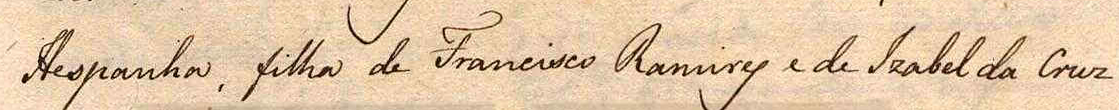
Hespanha, filha de Francisco Ramires e de Izabel da Cruz
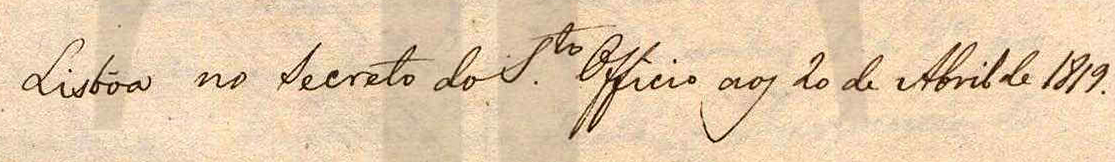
Lisboa no Secreto do S.to Officio aos 20 de Abril de 1819.
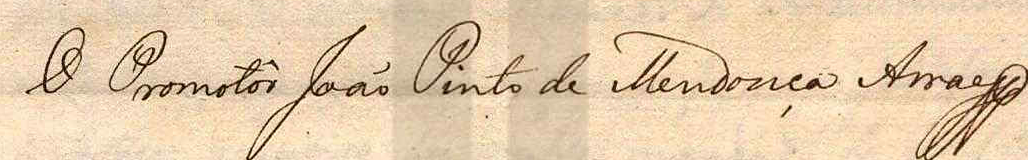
O Promotor Joaõ Pinto de Mendonça Arraes
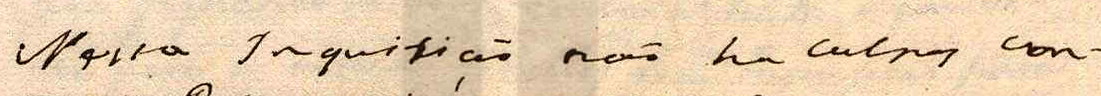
Nesta Inquiziçaõ naõ ha culpas con
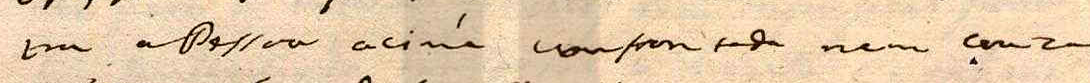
tra a Pessoa acima confrontada nem couza
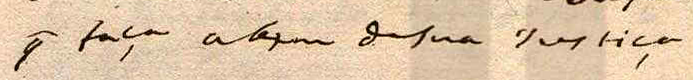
q̄ faça a bem de sua Iustiça
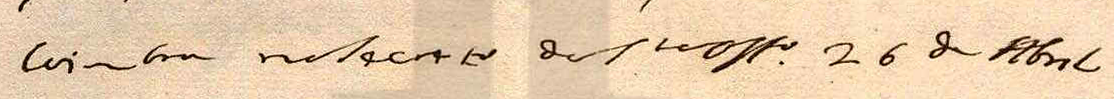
Coimbra no secreto de sto off.o 26 de Abril
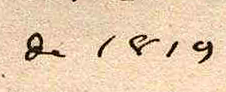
de 1819
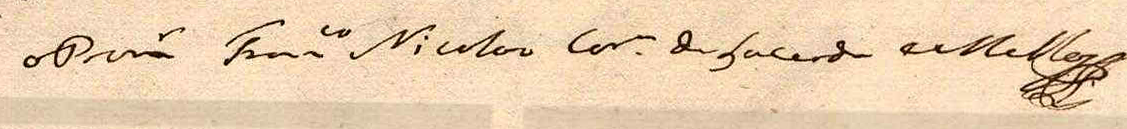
o Promr Franco Nicolao Cor. de Lacerda e Mello
